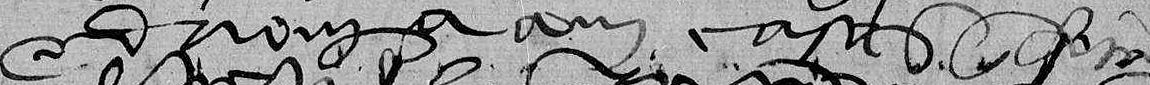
e da outa com casas q̄ forā
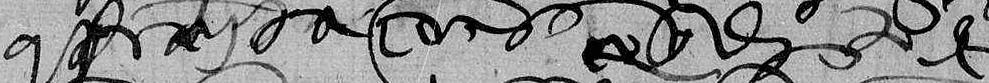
ꝯfrontações c̄o q̄ drto de
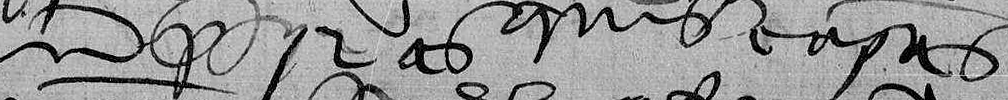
uē p̄tyr as quaes casas
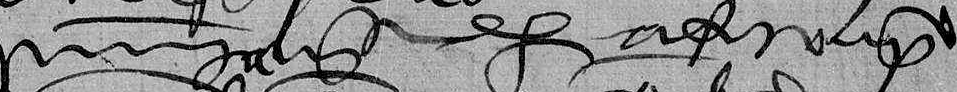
juntamte lhe aforou p̄o
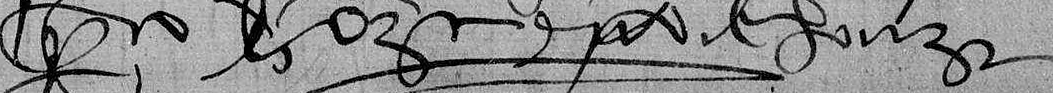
ꝑ̄ço de ōze djgo de honze
